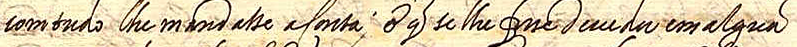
comtudo lhe mandasse a Conta; e q̄ se lhe fosse deuedor em alguā
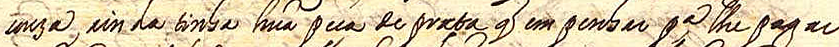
couza, ainda tinha huā peça de prata q̄ empenhar pa lhe pagar
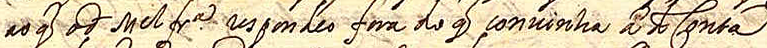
ao q̄ o d̄ Mel fra. respondeo fora do q̄ conuinha â d̄ Conta
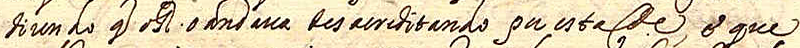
dizendo q̄ o R. o andaua desacreditando por esta Cde., e que
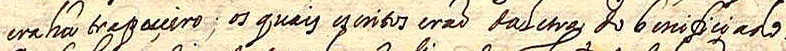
era hū trapaçeiro; os quais escritos erão da Letra do benificiado
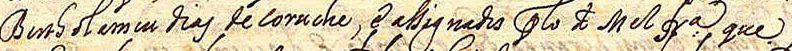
Bertholameu dias de coruche, e assignado p̄lo d̄ Mel fra. que
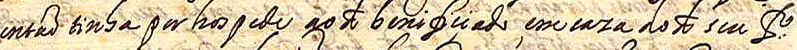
então tinha por hospede ao d̄ benificiado, em caza do d̄ seu fo.
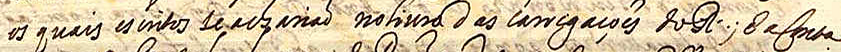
os quais escritos se acharião no liuro das carregaçoẽs do R.; e a Conta
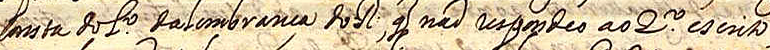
consta do L.o da lembrança do R., q̄ não respondeo ao 2.o escrito
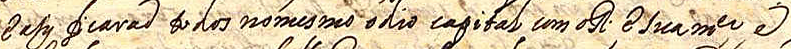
e asy ficaraõ todos no mesmo odio capital com o R., e sua mer, e
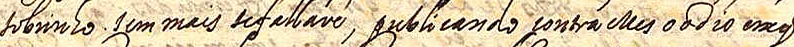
sobrinho sem mais se fallarē, publicando contra elles o odio em q̄
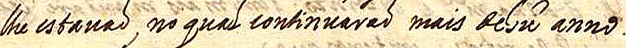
lhe estauão, no qual continuarão mais de hū anno.
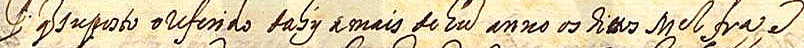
P. q̄ suposto o referido dahy a mais de hū anno os dittos Mel fra, e
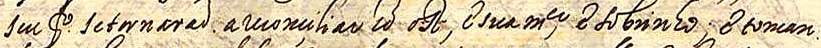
seu fo se tornarão a reconçiliar cō o R., e sua mer e sobrinho, e toman
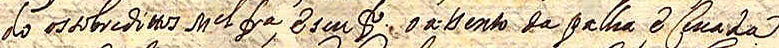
do os sobredittos Mel fra, e seu fo o assento da palha, e Ceuada
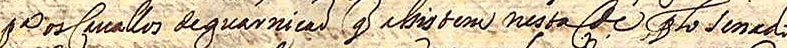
pa os Cauallos de guarnição q̄ assistem nesta Cde p̄lo Senado
